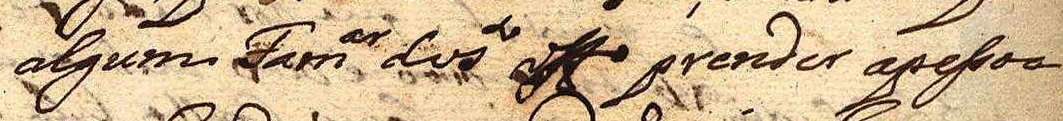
algum Famar do sto offo prender a pessoa
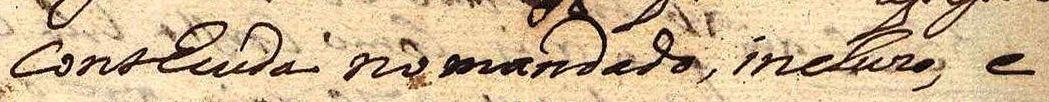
contheuda no mandado, incluzo, e
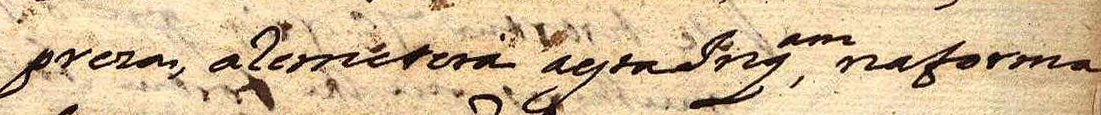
preza, a Remetera a esta Inqam, na forma
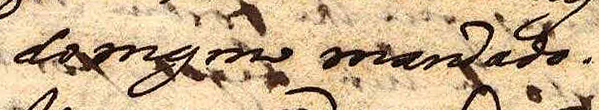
do mesmo mandado.
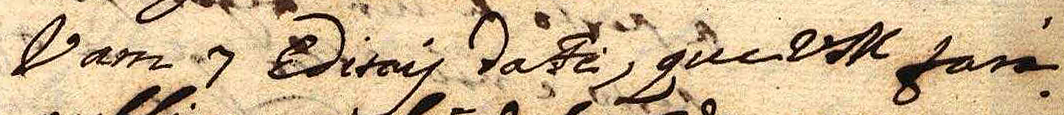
Vam 7 Editais da Fé, que V M fará
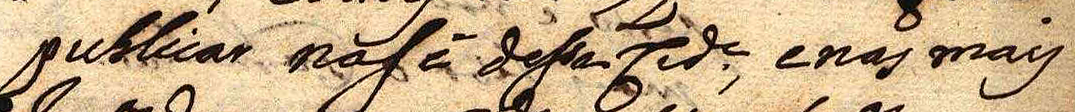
publicar na sé dessa Cid.e, e nas mais
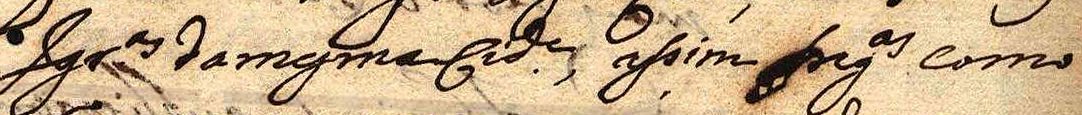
Igr.as da mesma Cid.e, assim fregas como
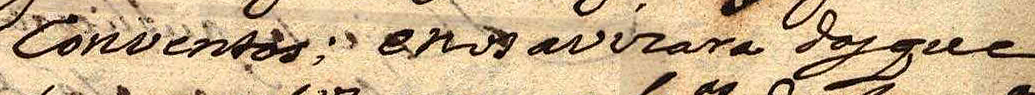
conventos; e nos avizara dos que
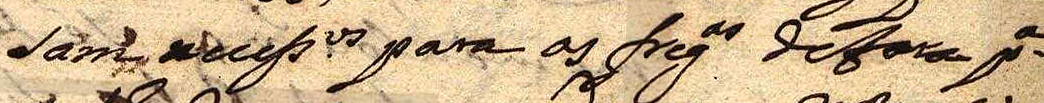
sam necess.os para as fregas de fora p.a
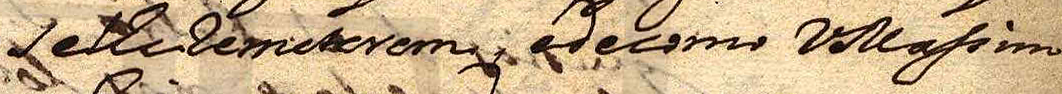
se lhe Remeterem; e de como V M assim
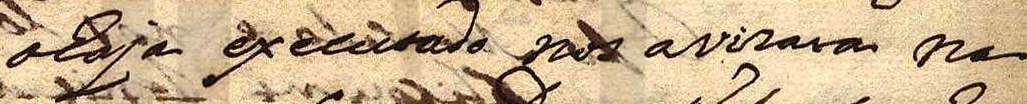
a haja executado nos avizara na
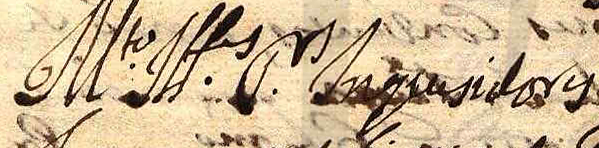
M.to Ill.es S.rs Inquesidores
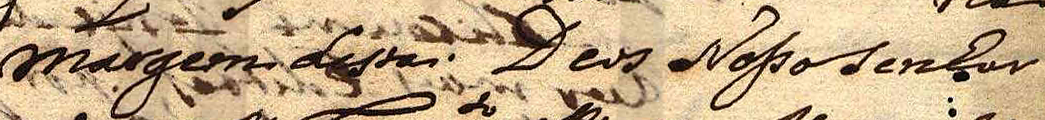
margem desta. Deos Nosso Senhor
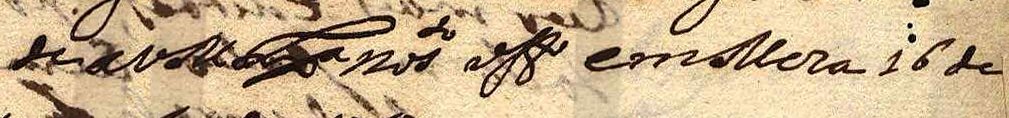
gde a V M Lxa no sto offo em Meza 16 de
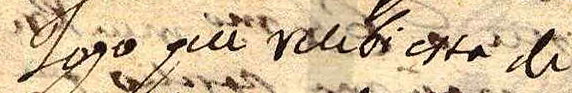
Logo que recebi esta de
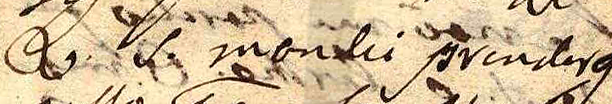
v. s. mandei prender
